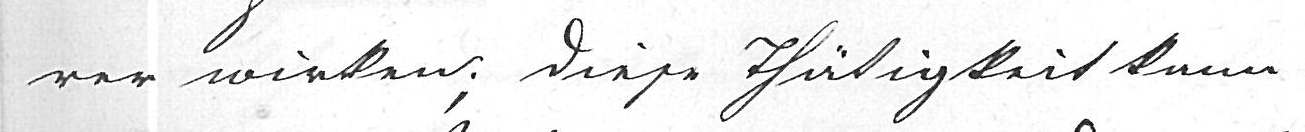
rer wirken; diese Thätigkeit kann
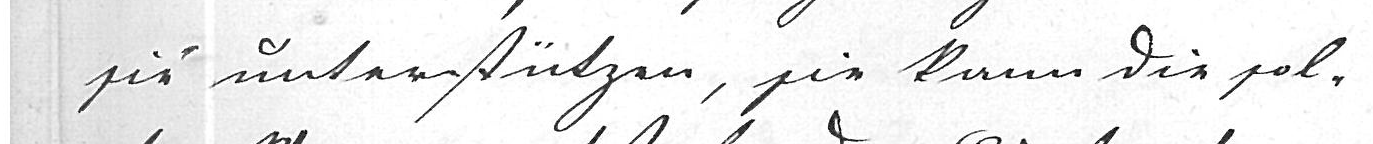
sie unterstützen, sie kann die sol-
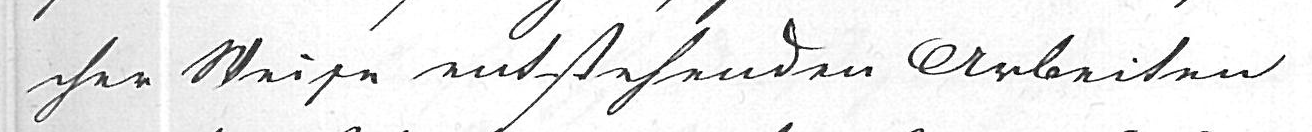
cher Weise entstehenden Arbeiten
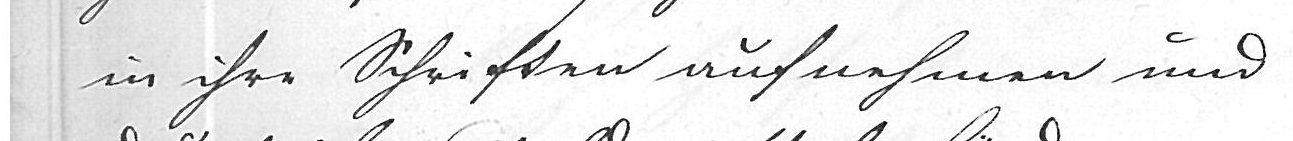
in ihre Schriften aufnehmen und
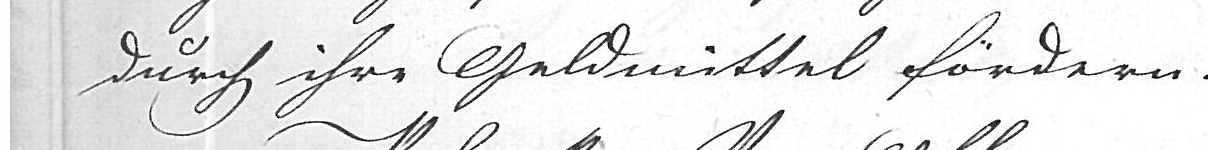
durch ihre Geldmittel fördern.
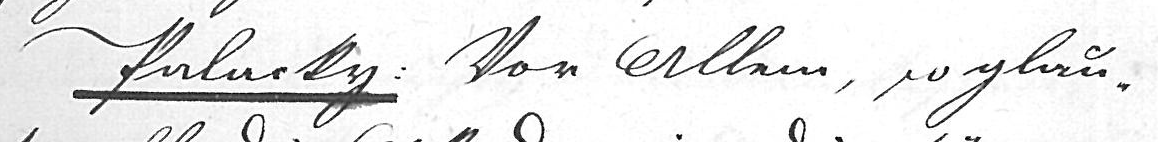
Palacky: Vor Allem, so glau-
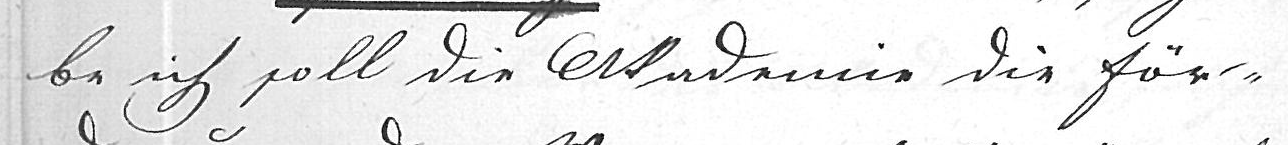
be ich soll die Akademie die För-
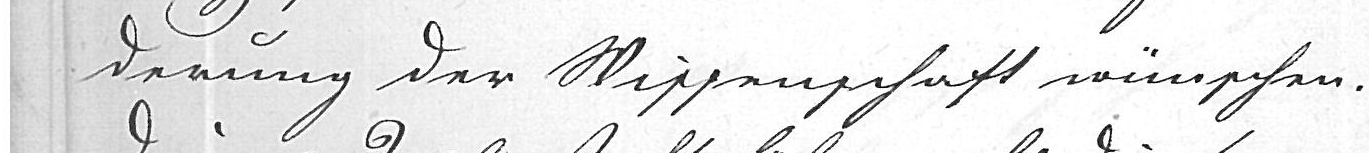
derung der Wissenschaft wünschen.
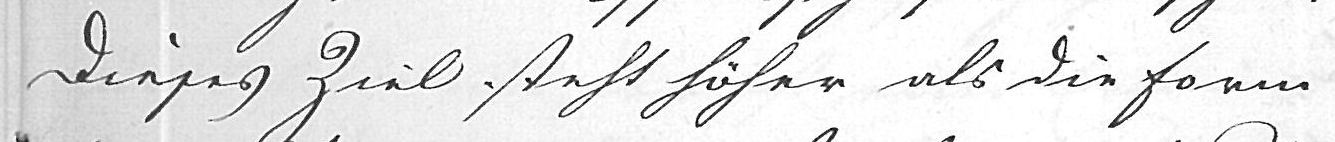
Dieses Ziel steht höher als die Form
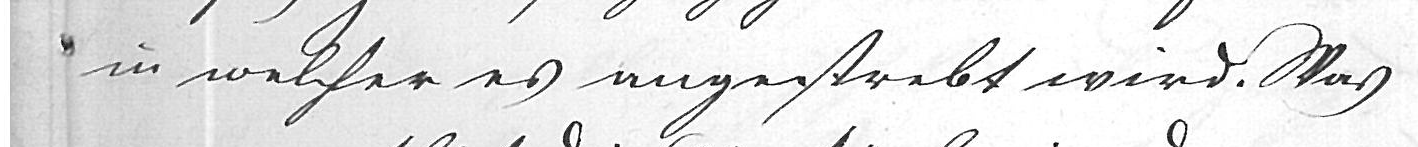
in welcher es angestrebt wird. Was
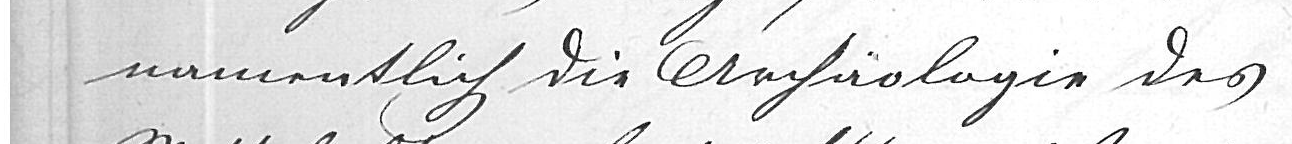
namentlich die Archäologie des
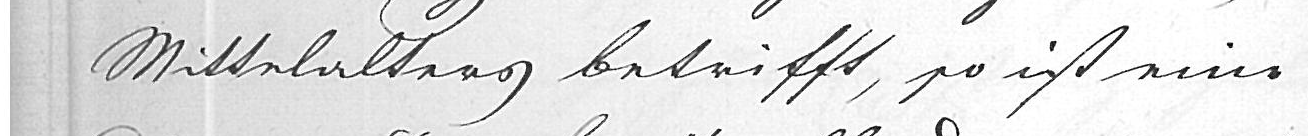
Mittelalters betrifft, so ist eine
